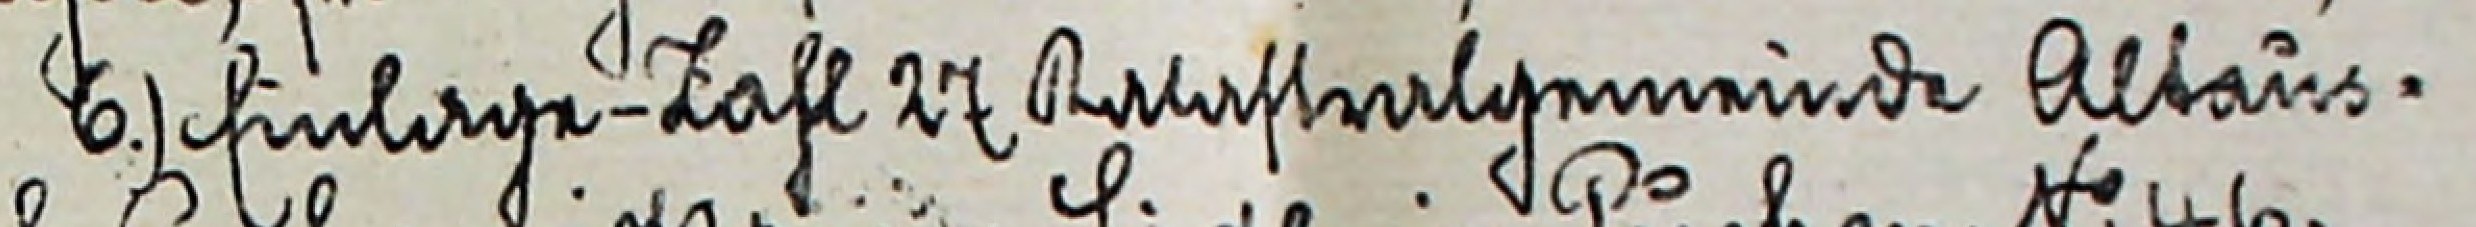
6.) Einlage - Zahl 27 Katastralgemeinde Altaus=
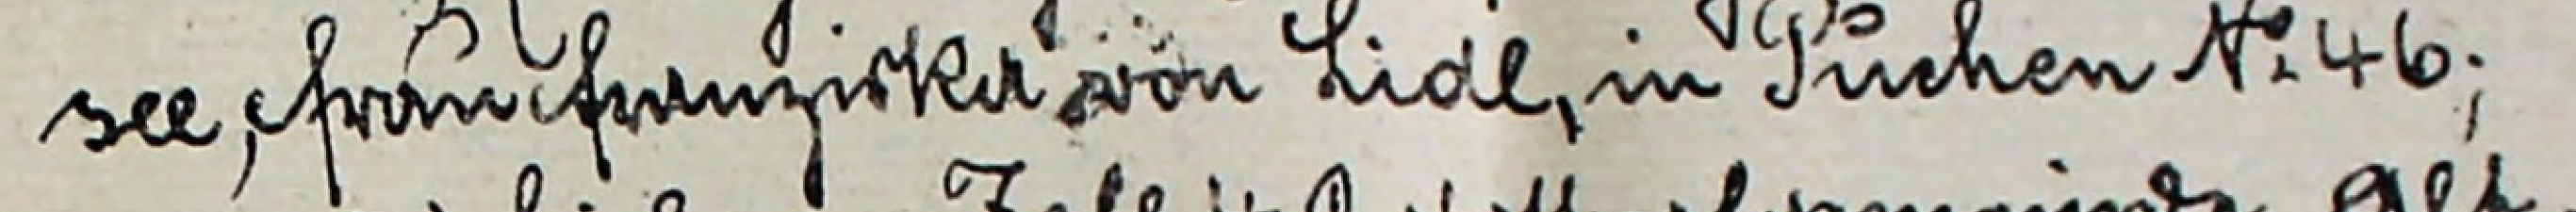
see, Frau Franziska von Lidl, in Puchen No 46;
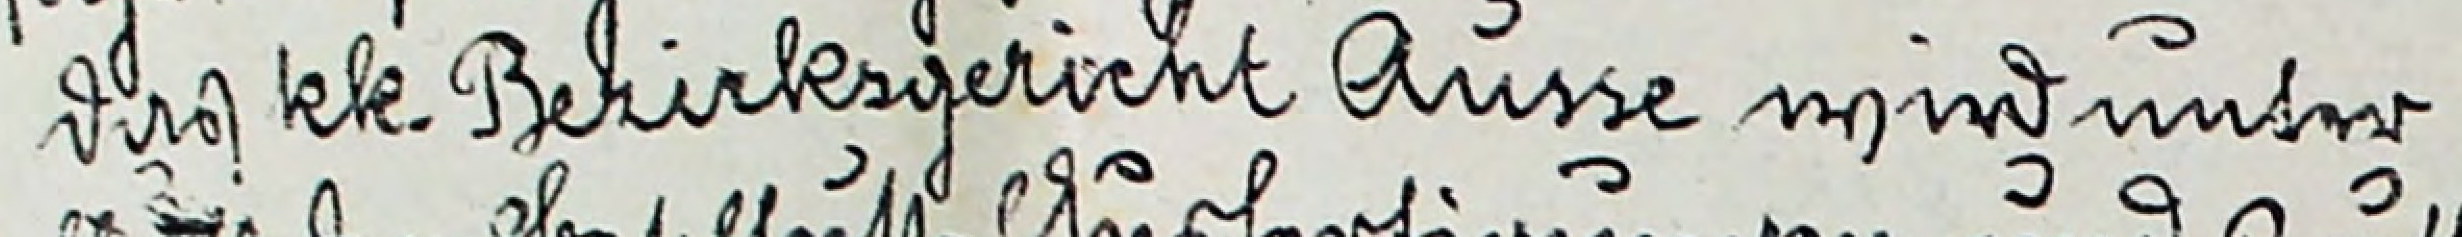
Das kk. Bezirksgericht Ausse wird unter
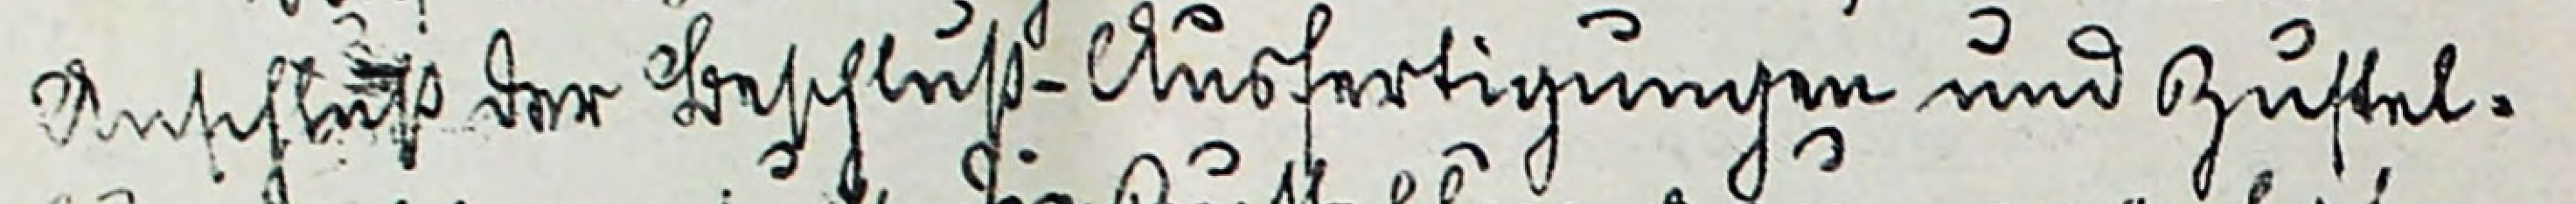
Anschluß der Beschluß - Ausfertigungen und Zustel=
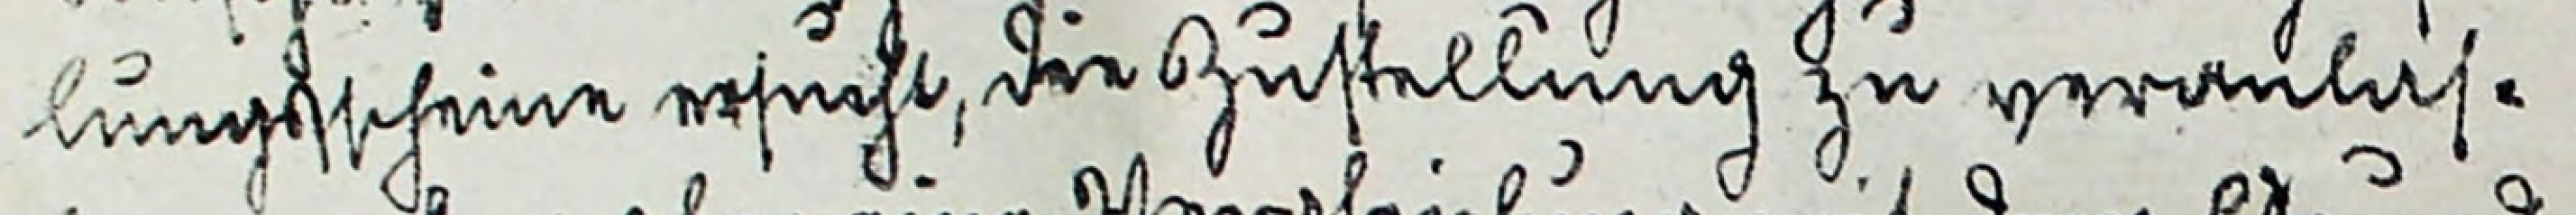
lungsscheine ersucht, die Zustellung zu veranlas=
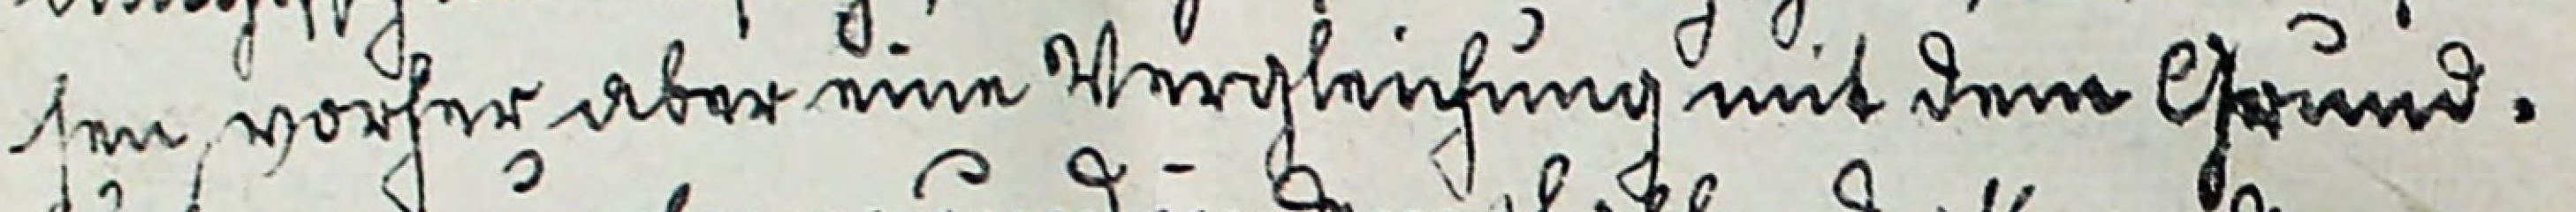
sen vorher aber eine Vergleichung mit dem Grund=
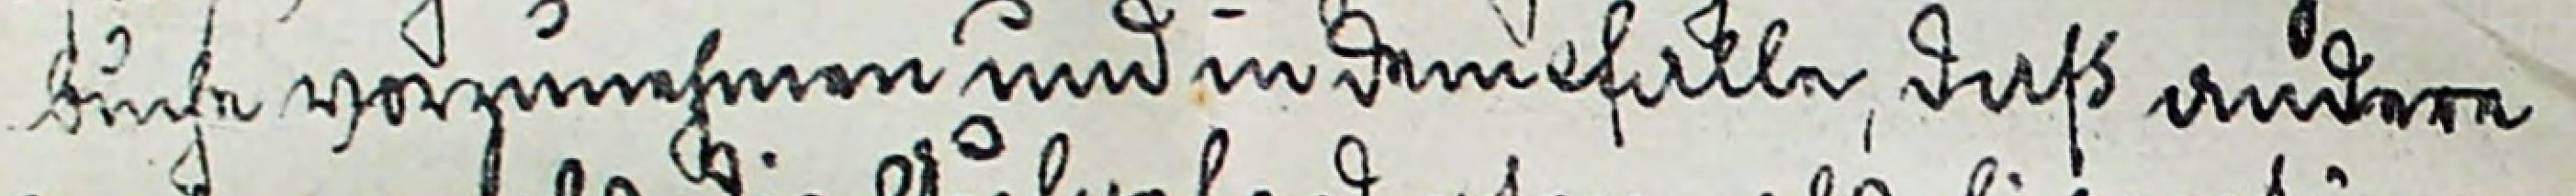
buche vorzunehmen und in dem falle, daß andere
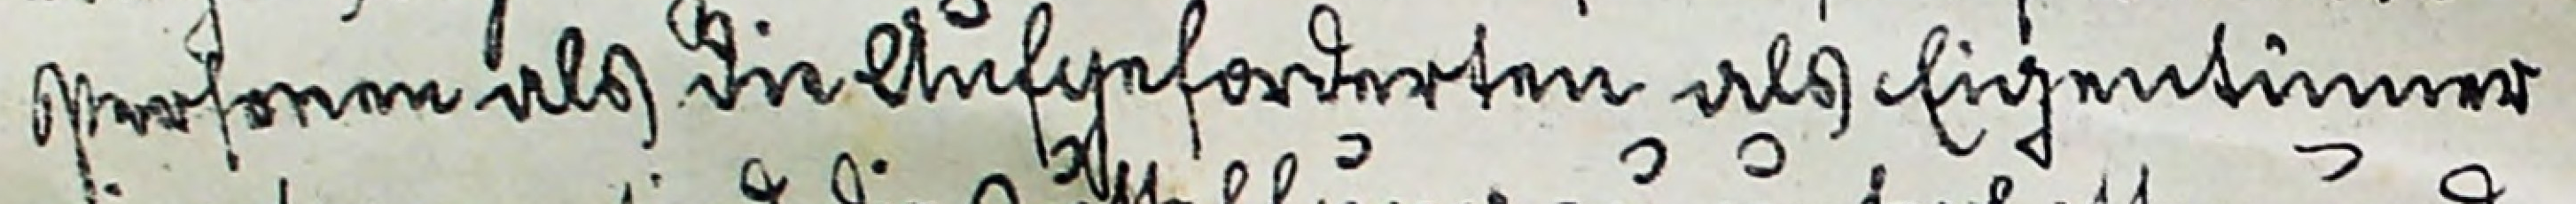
Personen als die Aufgeforderten als Eigentümer
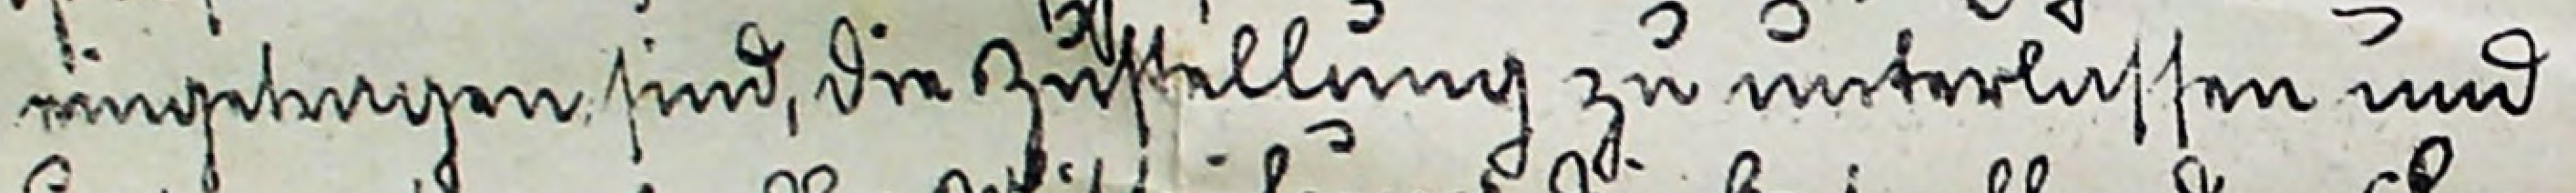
eingetragen sind, die Zustellung zu unterlassen und
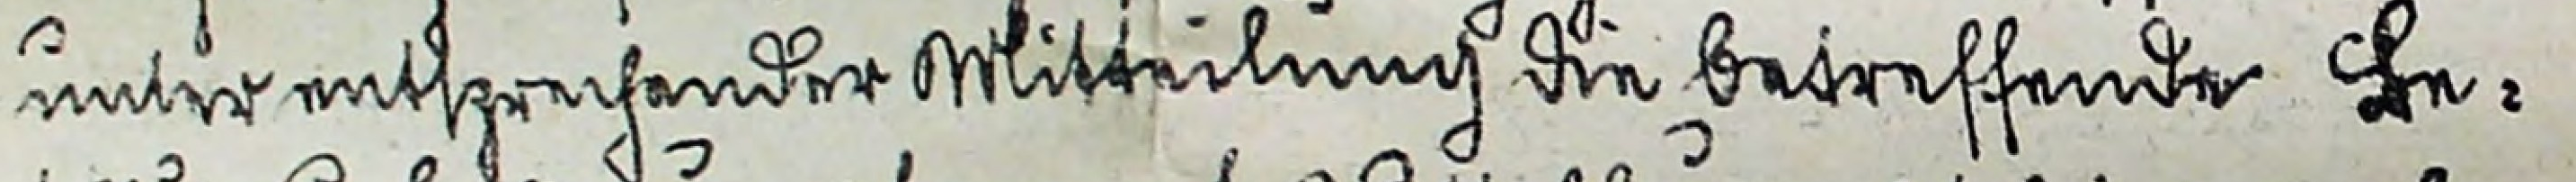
unter entsprechender Mitteilung die betreffende Be=
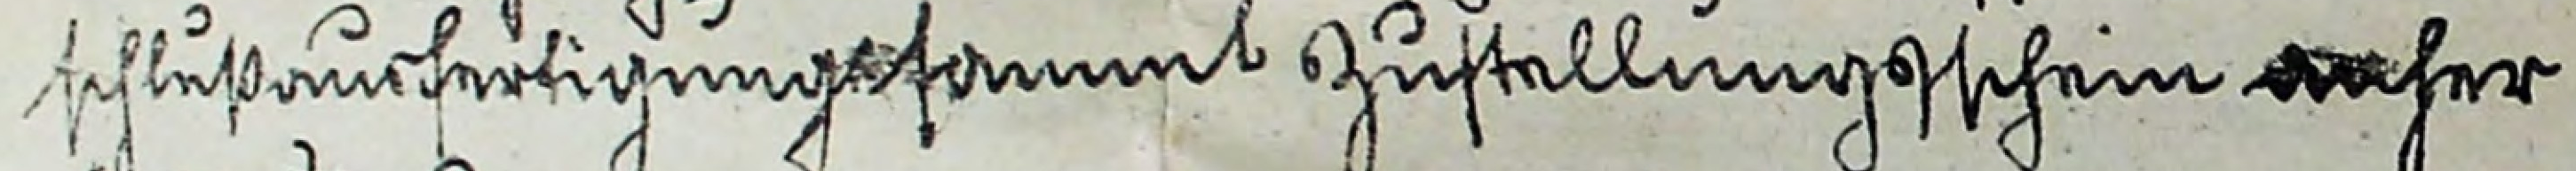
schlußausfertigung sammt Zustellungsschein ???anher
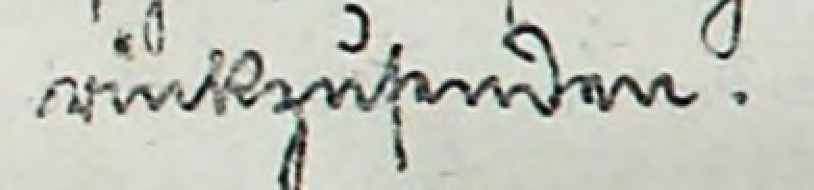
rinkzusenden.
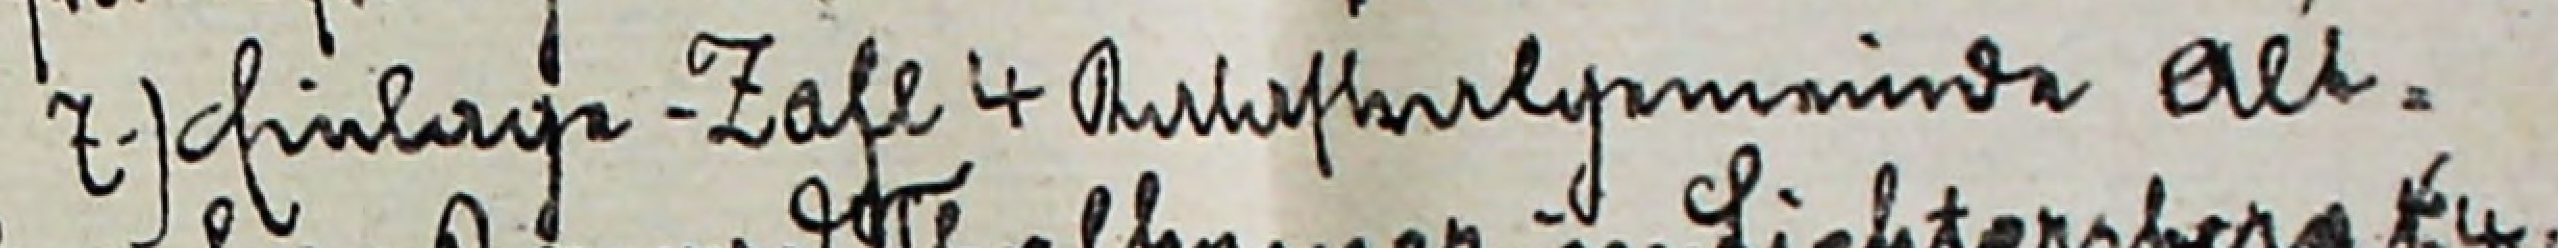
7.) Einlage - Zahl 4 Katastralgemeinde Alt=
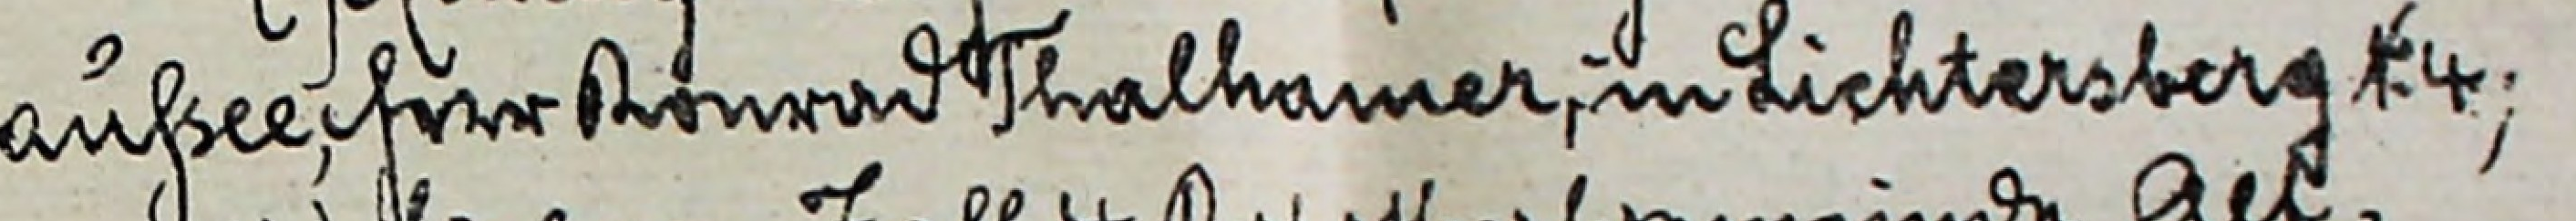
aussee, Herr Konrad Thalhamer, in Lichtersberg No4;
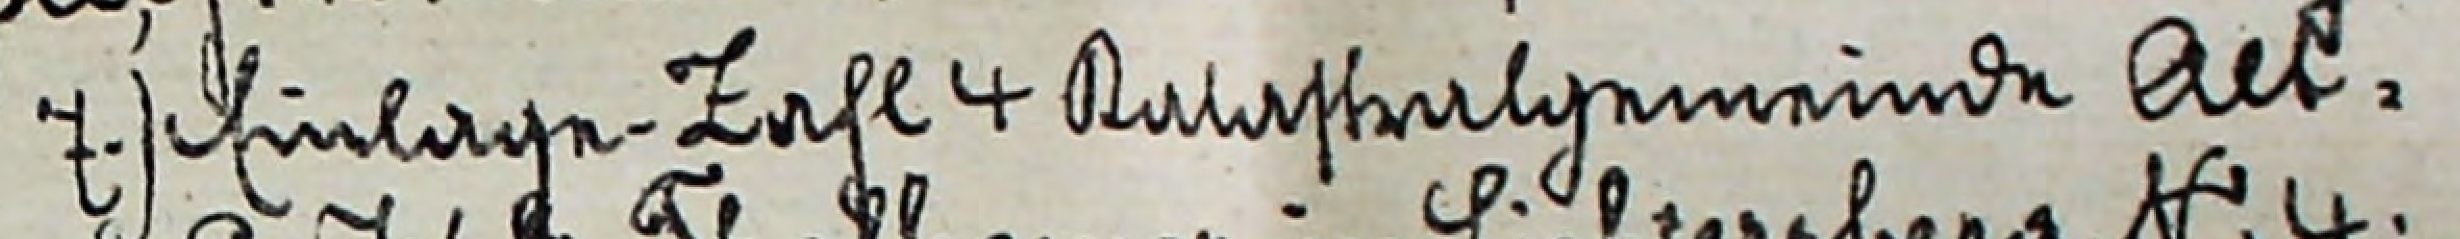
7.) Einlage - Zahl 4 Katastralgemeinde Alt=
